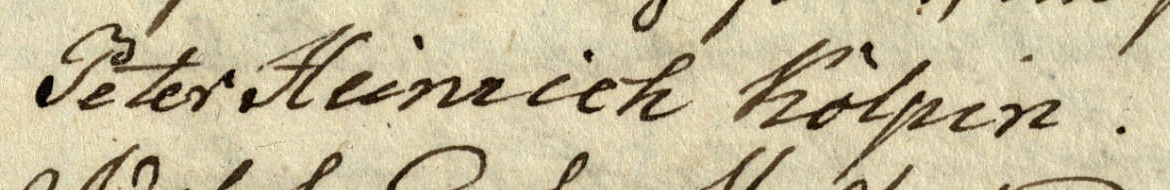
Peter Heinrich Kölpin
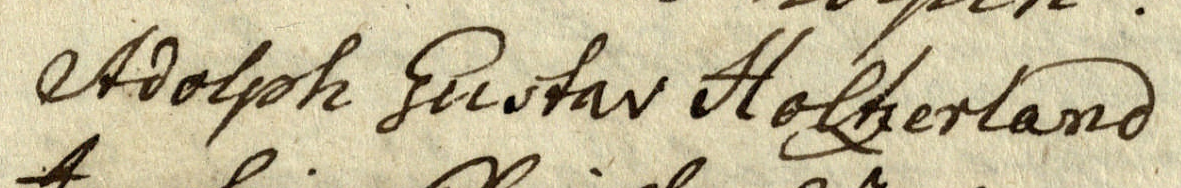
Adolph Gustav Holtzerland
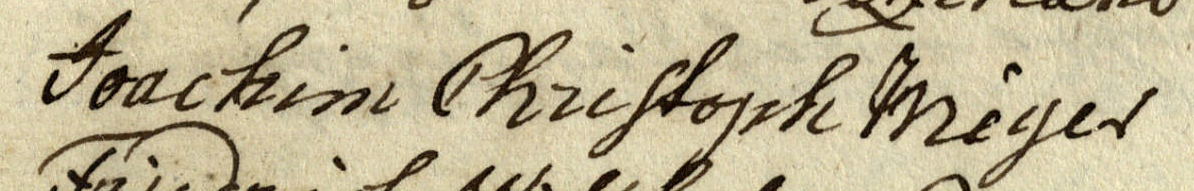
Joachim Christoph Meyer
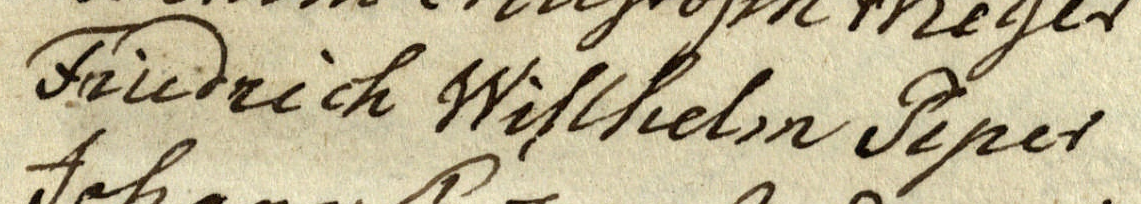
Friedrich Willhelm Piper
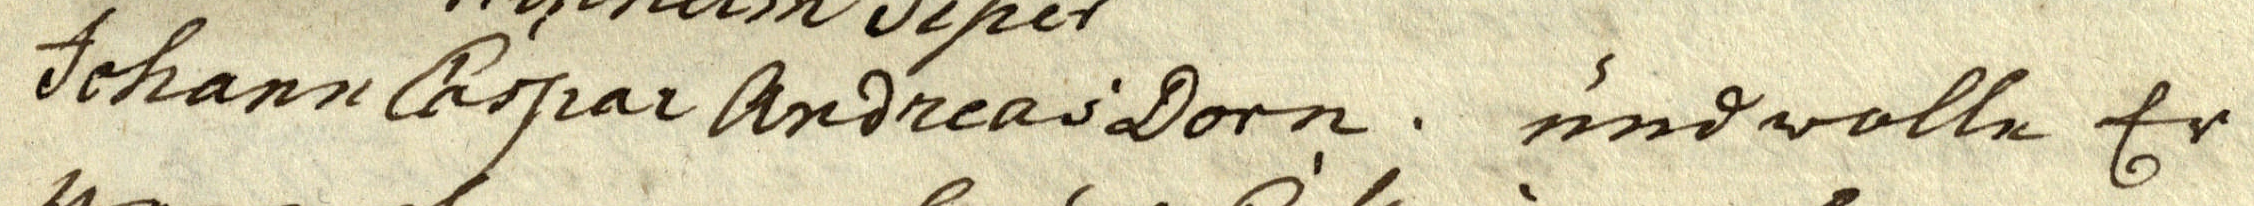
Johann Caspar Andreas Dorn. und wolle Er
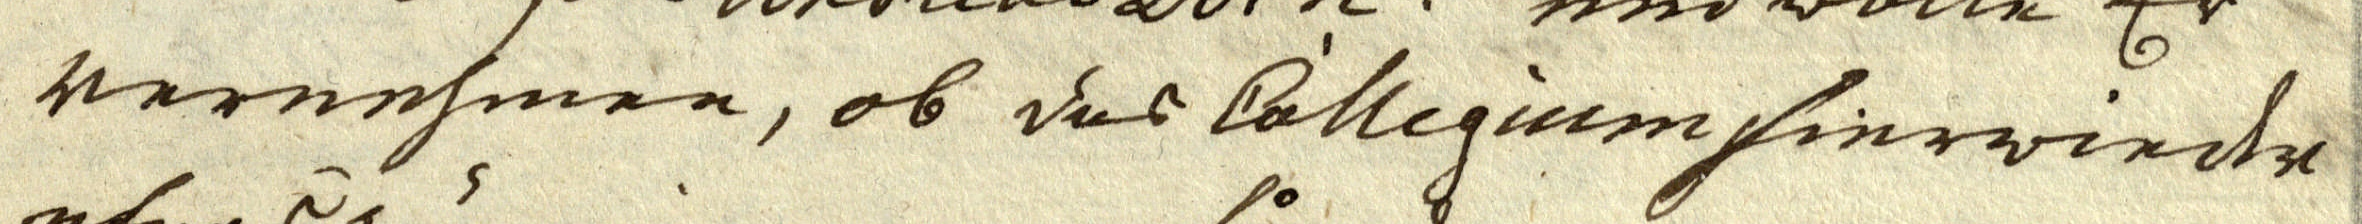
vernehmen, ob das Collegium hierwieder
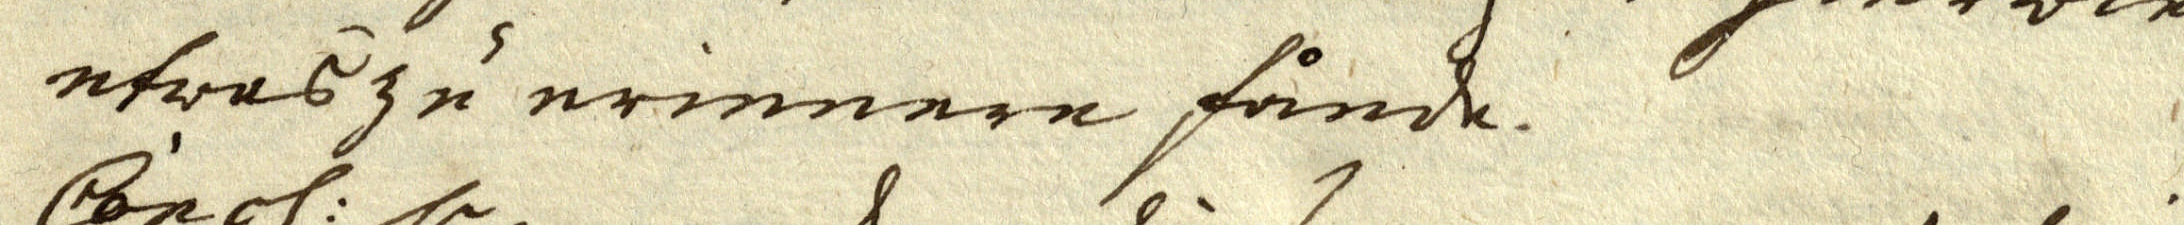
etwas zu erinnern fände.
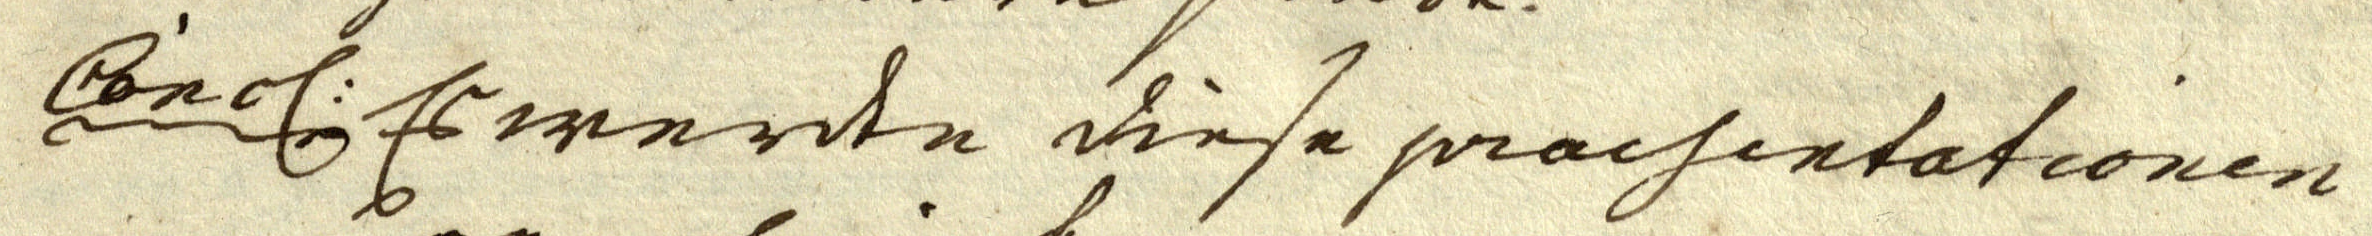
Concl. Es werden diese praesentationen
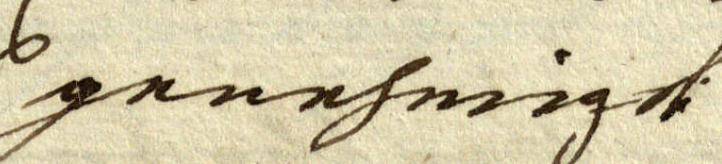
genehmiget
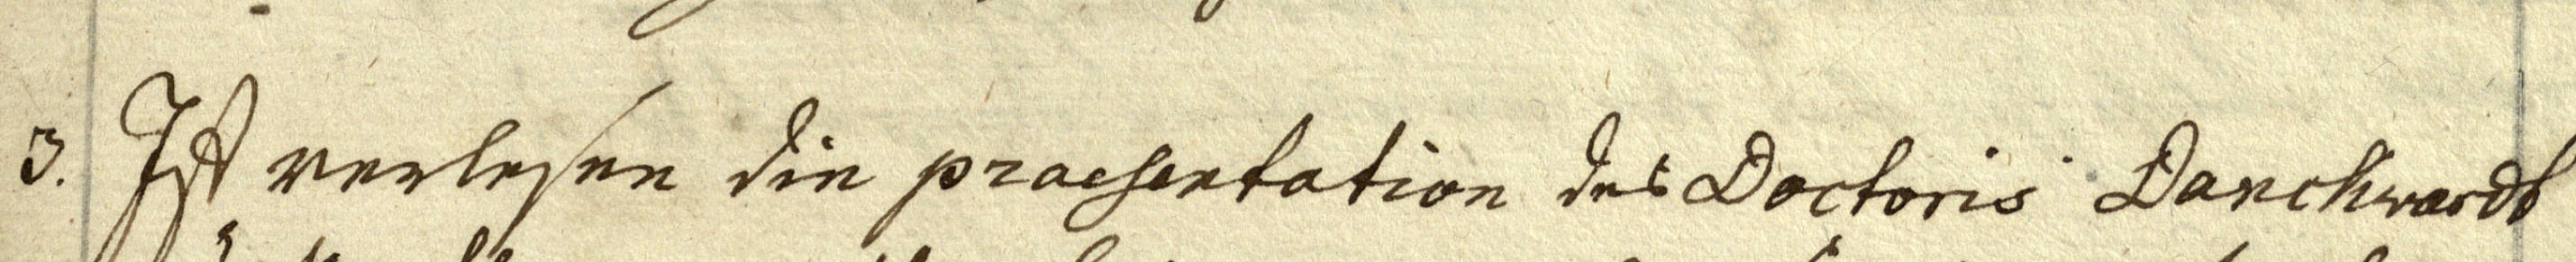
3. Ist verlesen die praesentation des Doctoris Danckwardt
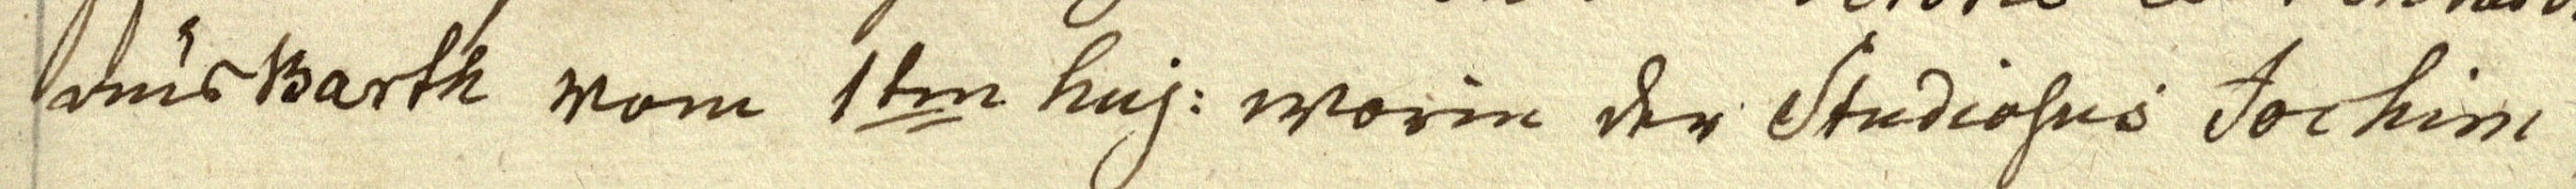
aus Barth vom 1ten huj. worin der Studiosus Jochim
